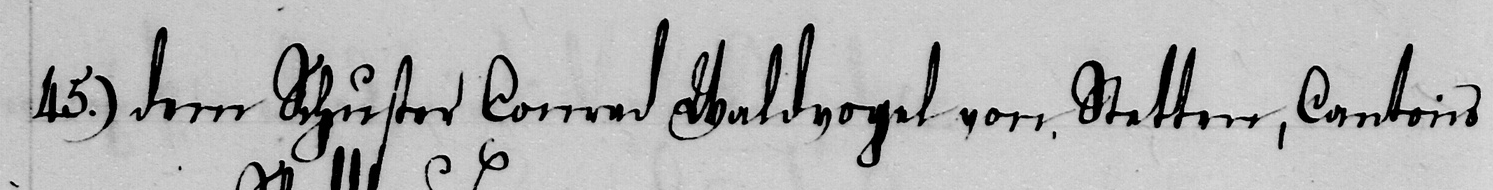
45.) dem Schuster Conrad Waldvogel von Stetten, Cantons
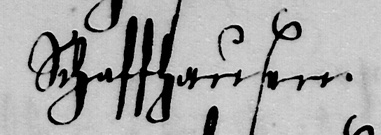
Schaffhausen.
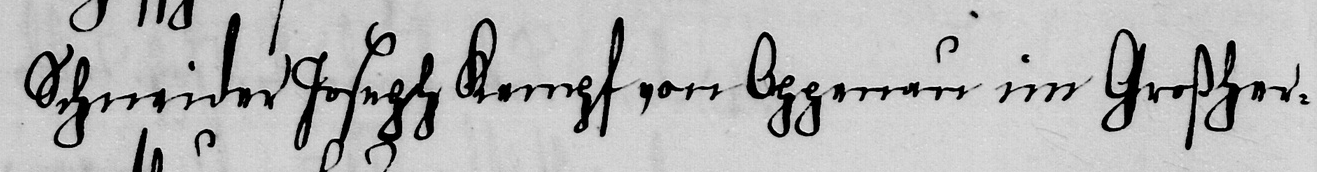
Schneider Joseph Kempf von Appenau im Großher¬
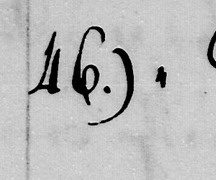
46.) “
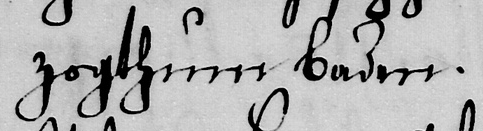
zogthum Baden.
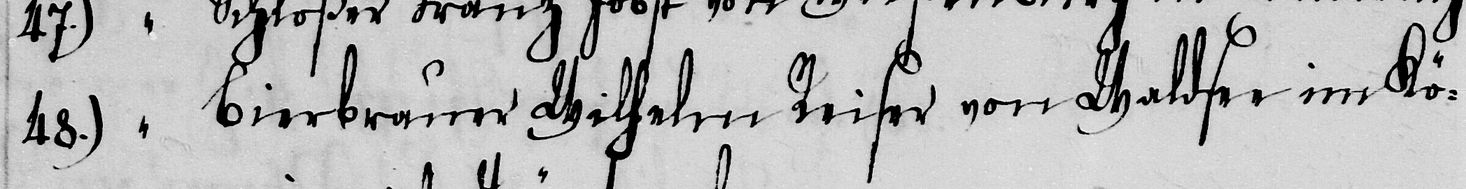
48.) “ Bierbrauer Wilhelm Reiser von Waldsee im Kö¬
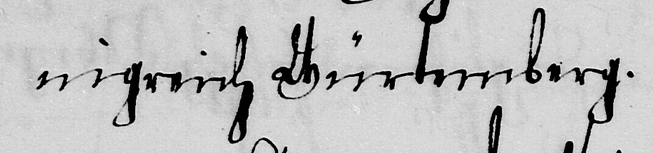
nigreich Würtemberg.
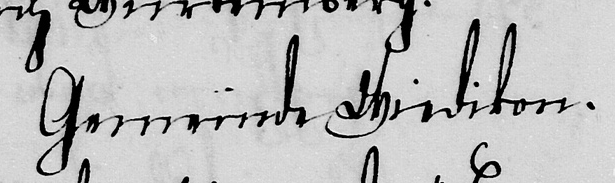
Gemeinde Wiedikon.
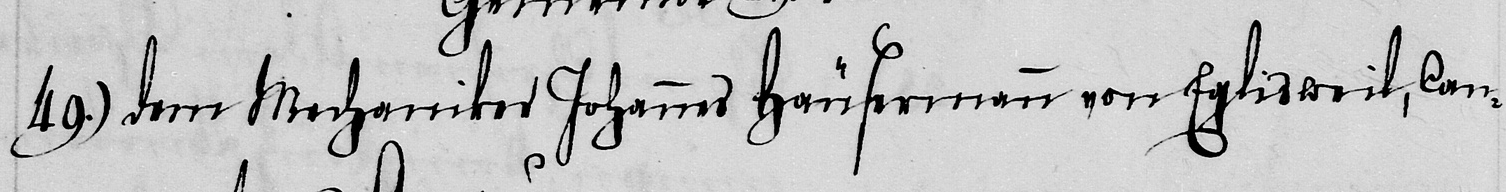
49.) dem Mechaniker Johannes Häusermann von Eglisweil, Can¬
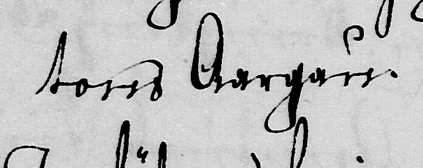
tons Aargau.
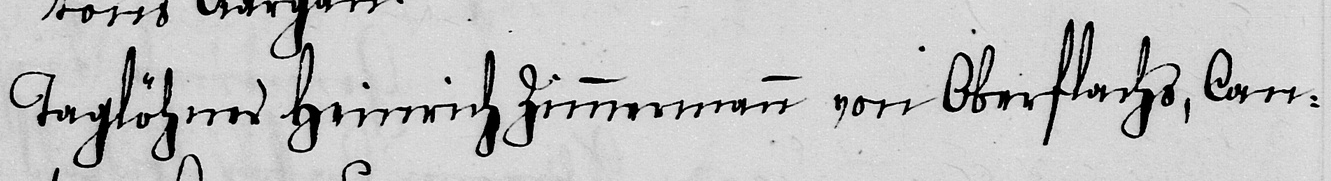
Taglöhner Heinrich Zimmermann von Oberflachs, Can¬
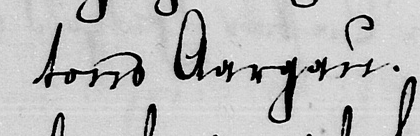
tons Aargau.
